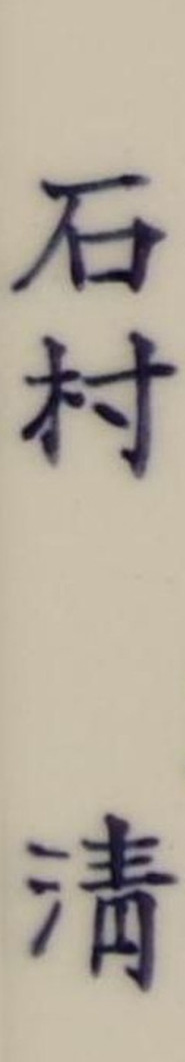石村清

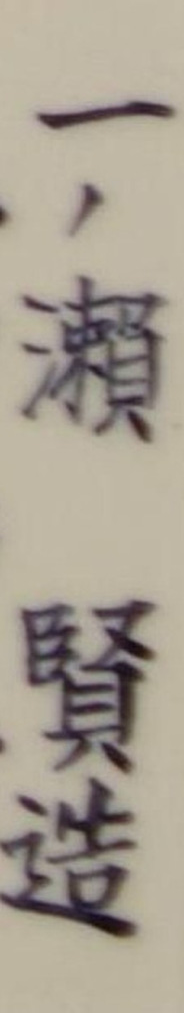一ノ瀬賢造
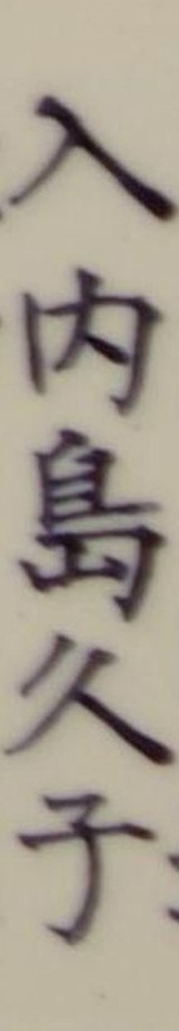入内島久子
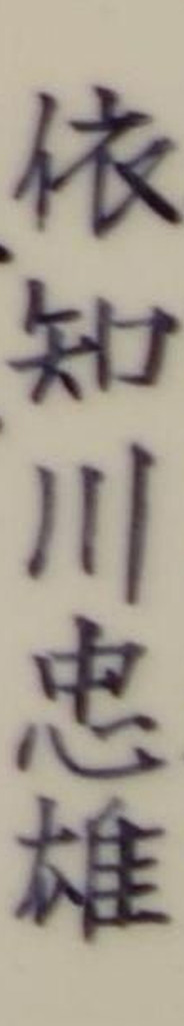依知川忠雄
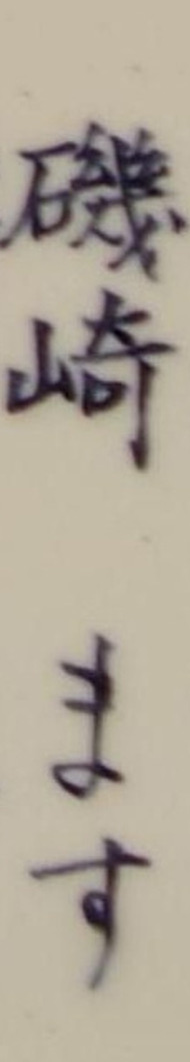磯崎ます
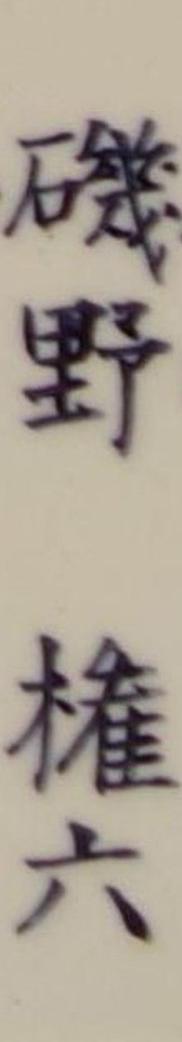磯野権六
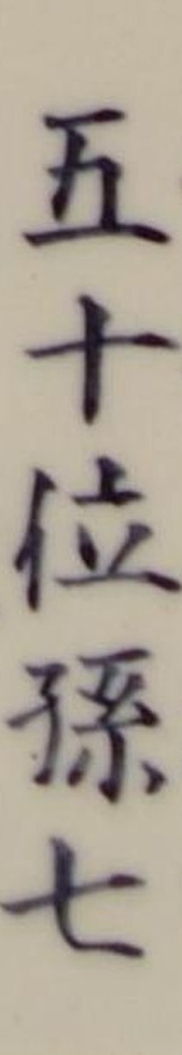五十位孫七
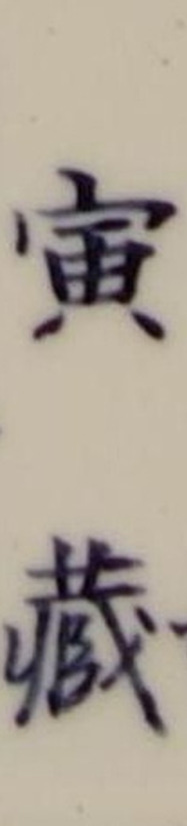原寅蔵
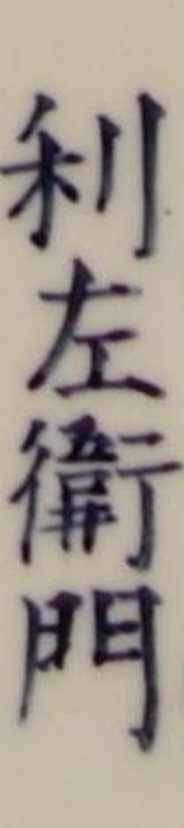利左衛門
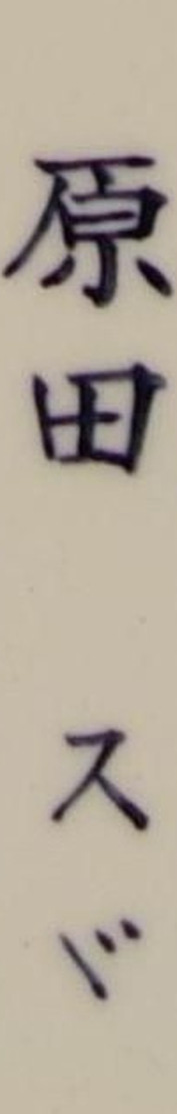原田スゞ
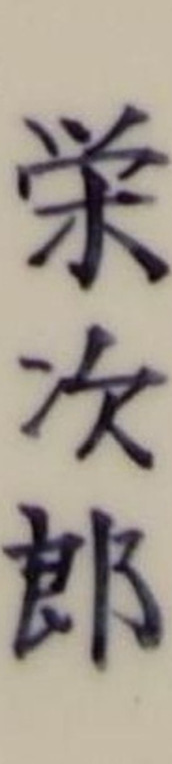栄次郎
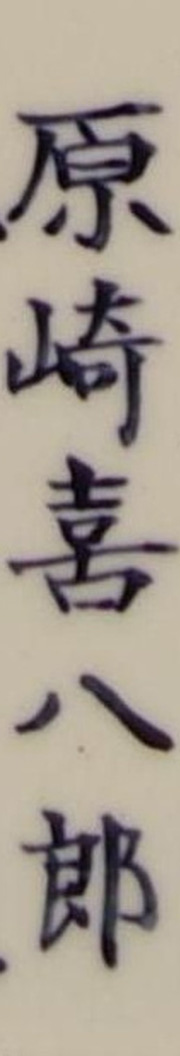原崎喜八郎
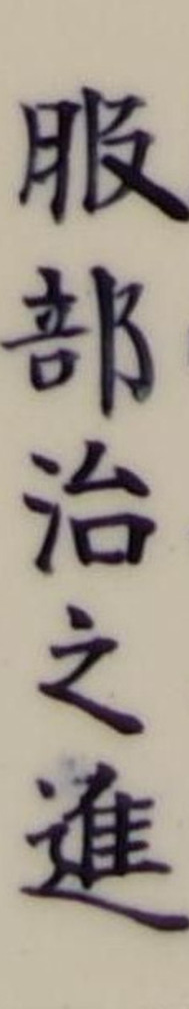服部治之進
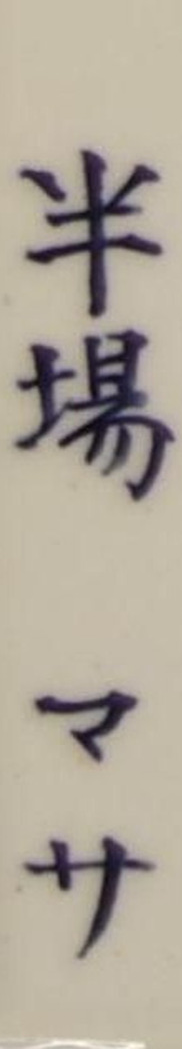半場マサ

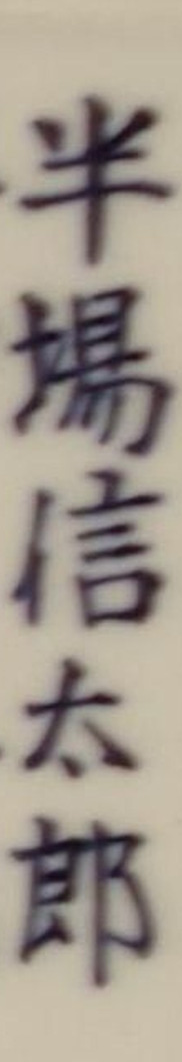半場信太郎
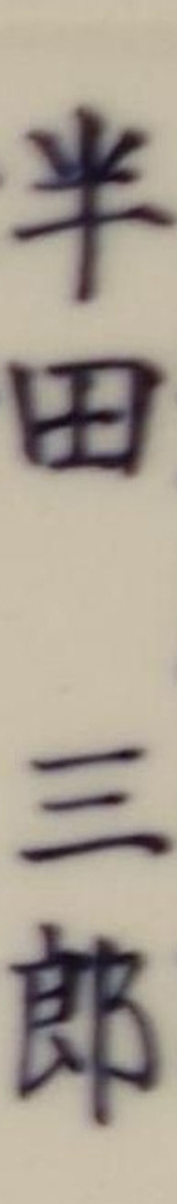半田三郎
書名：M~S
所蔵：高野山金剛峯寺
